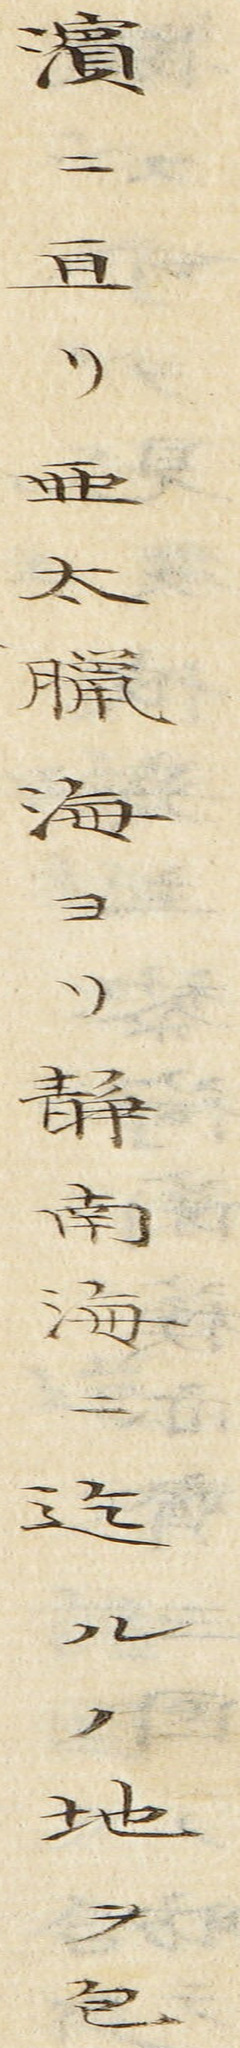濵ニ亘リ亜太臘海ヨリ静南海ニ迄ルノ地ヲ包
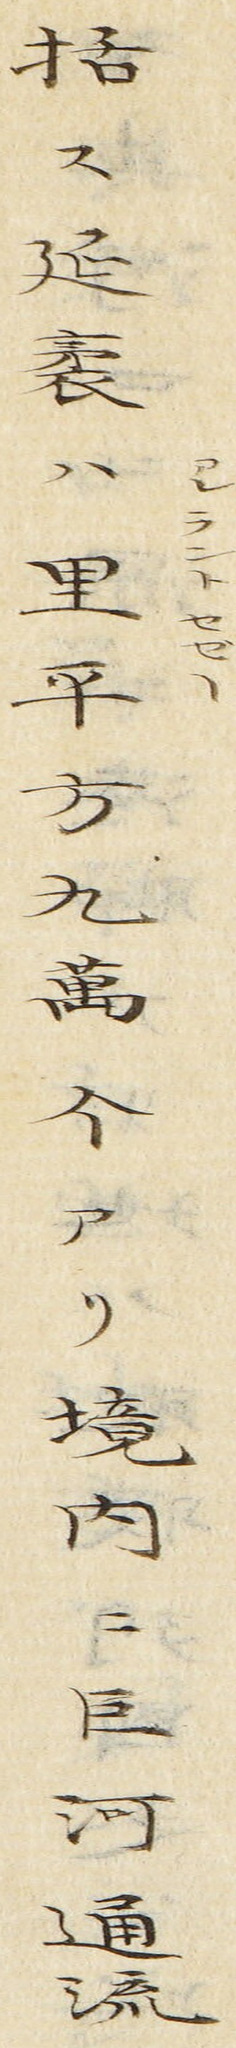括ス延袤ハ里平方九萬个アリ境内ニ巨河通流

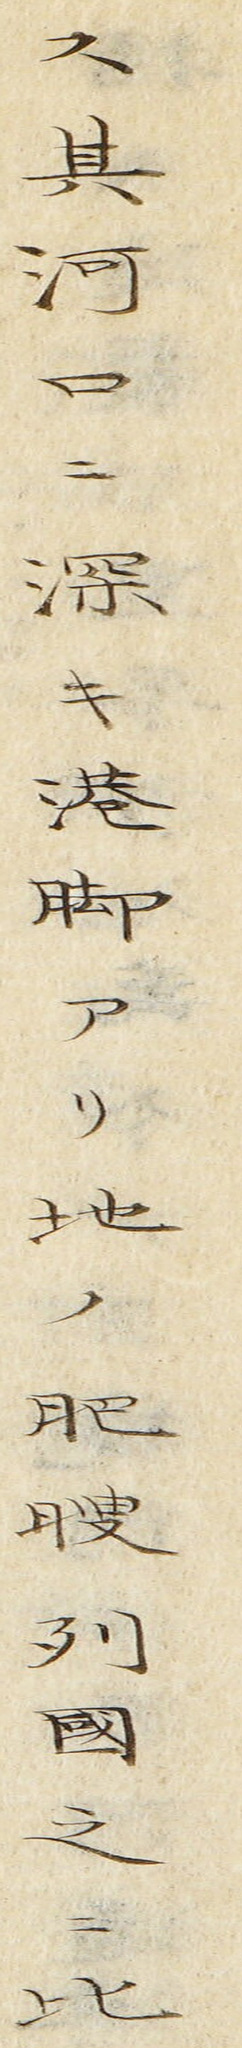ス其河口ニ深キ港脚アリ地ノ肥膄列國之ニ比
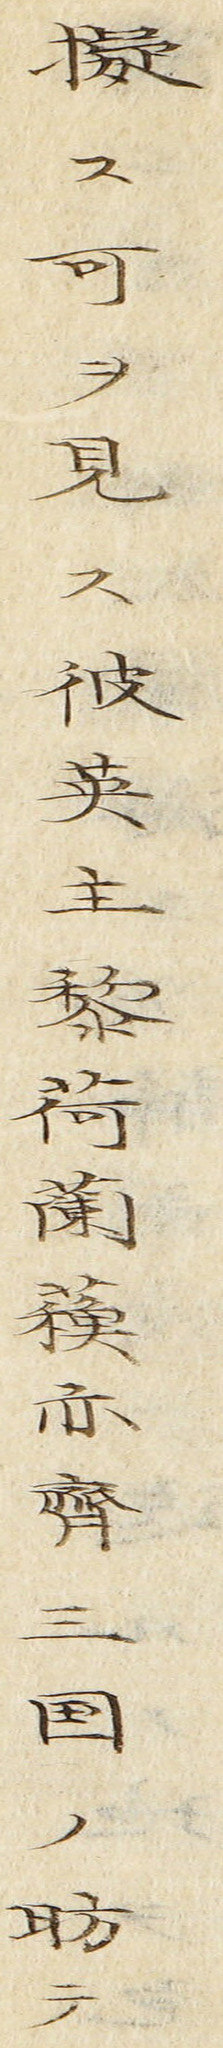擬ス可ヲ見ス彼英主黎荷蘭蘓亦齊三国ノ昉テ
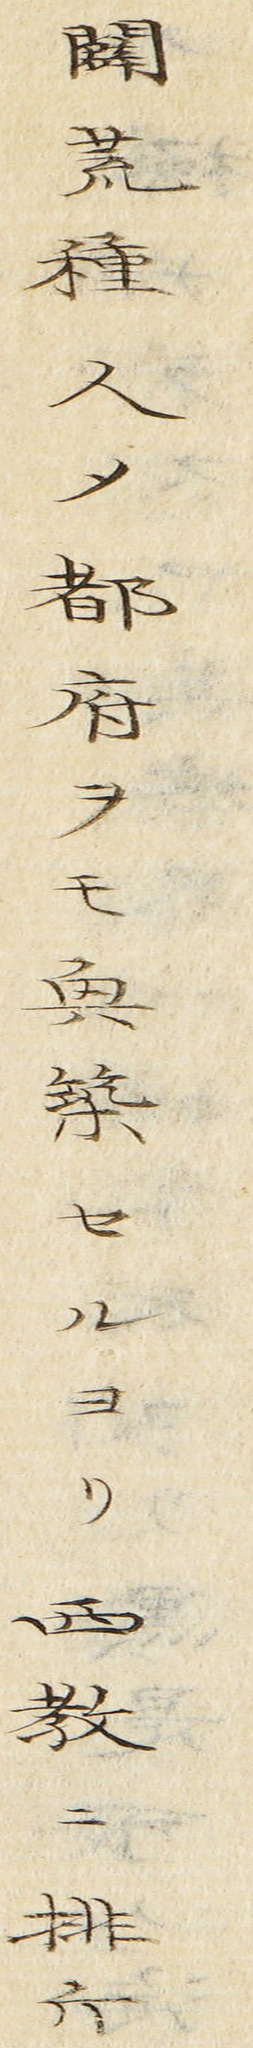闢荒種人シテ都府ヲモ奥築セルヨリ西教ニ排斥
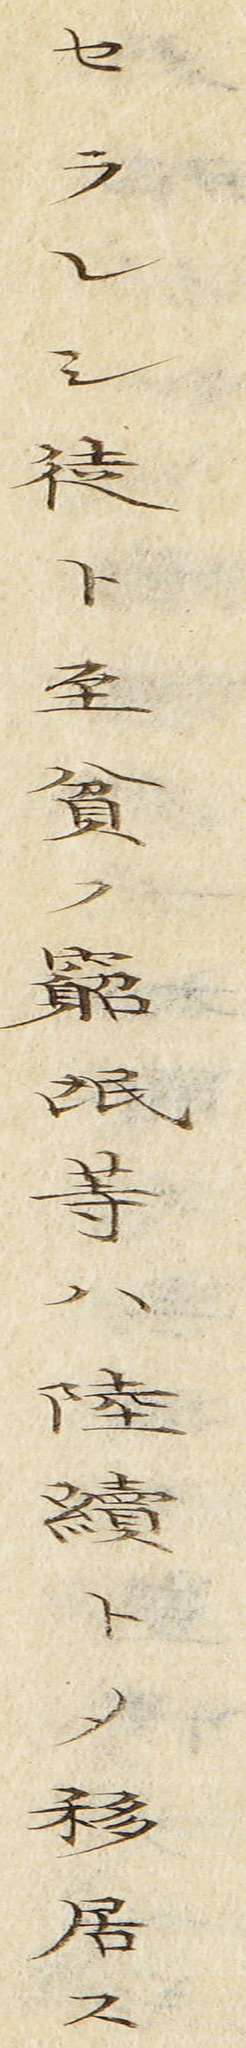セラレシ徒ト至貧ノ窮？氓等ハ陸續トシテ移居ス
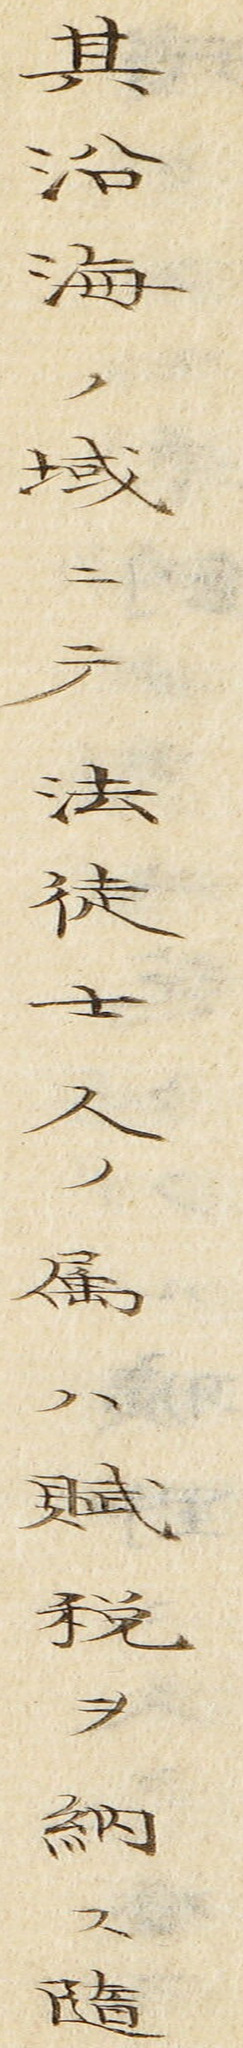其沿海ノ域ニテ法徒士人ノ属ハ賦税ヲ納ス隨
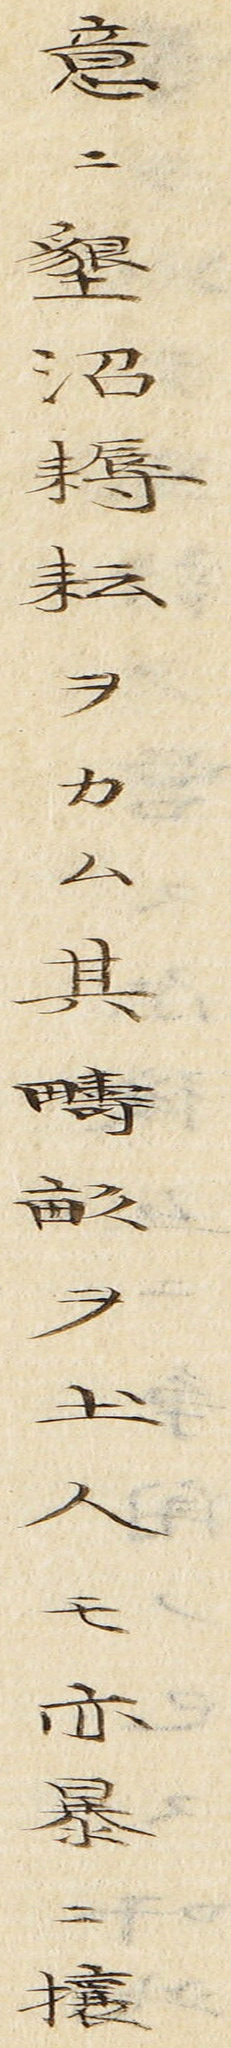意ニ墾沼耨耘ヲカム其疇畝ヲ土人モ亦暴ニ攘
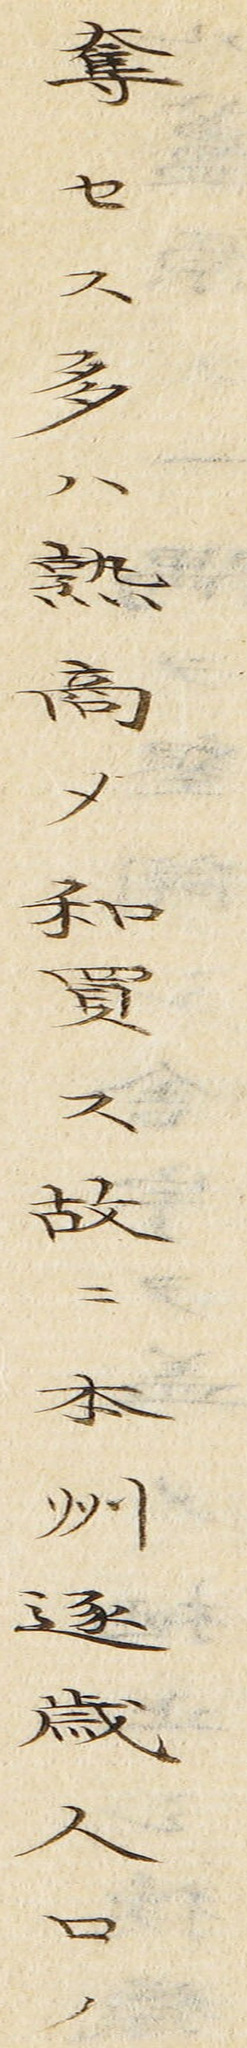奪セス多ハ熟商シテ和買ス故ニ本州逐歳人口ノ
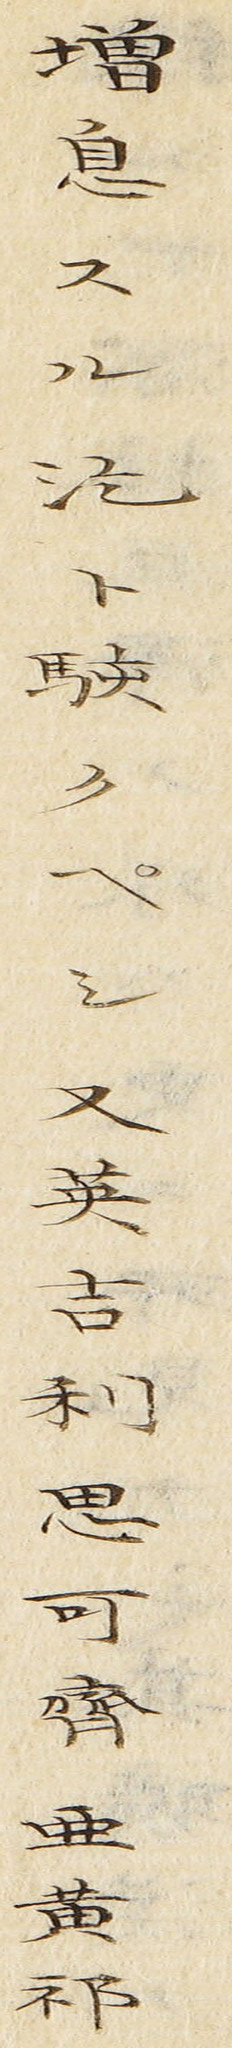増息スル汔ト駭クベシ又英吉利思可齊亜黄祁
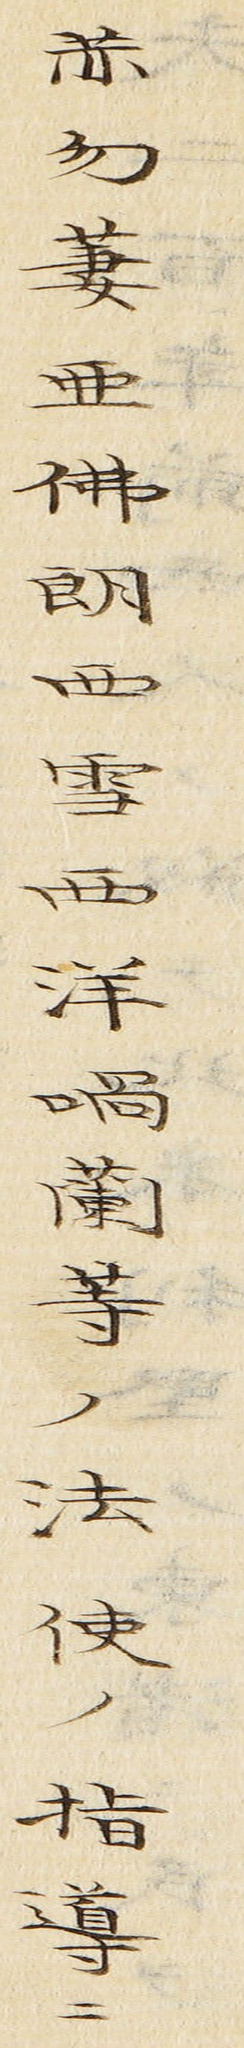勿萋亜佛朗西雪西洋喎蘭等ノ法使ノ指導ニ
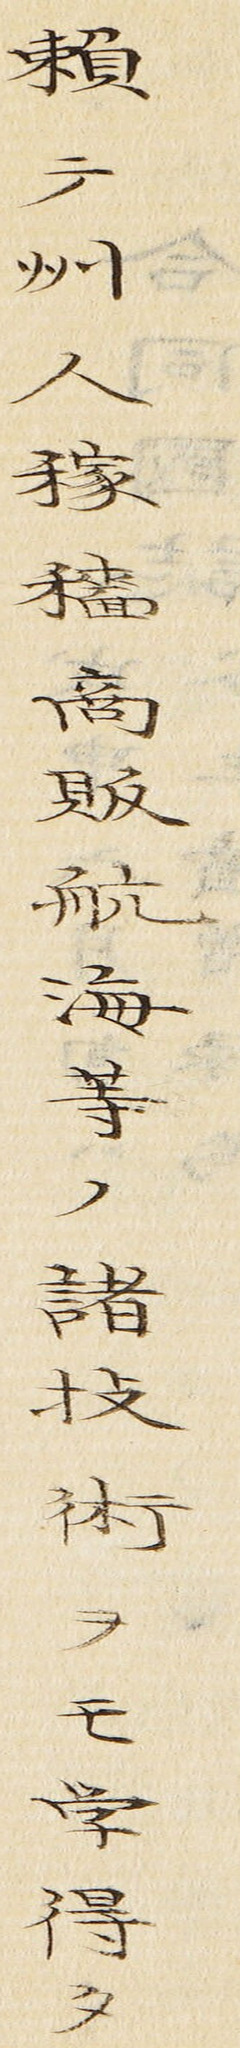賴テ州人稼穡商販航海等ノ諸技術ヲモ学得タ
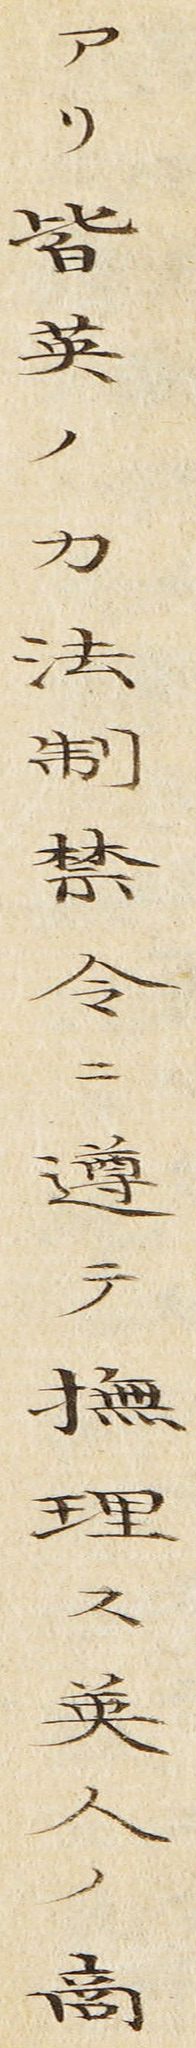アリ皆英ノ力法制禁令ニ遵テ撫理ス英人ノ商
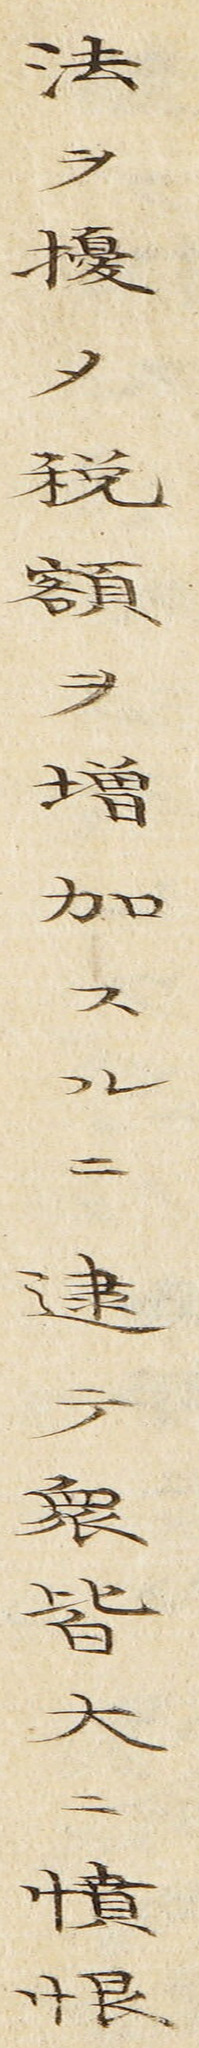法ヲ擾シテ税額ヲ増加スルニ逮テ衆皆大ニ憤恨
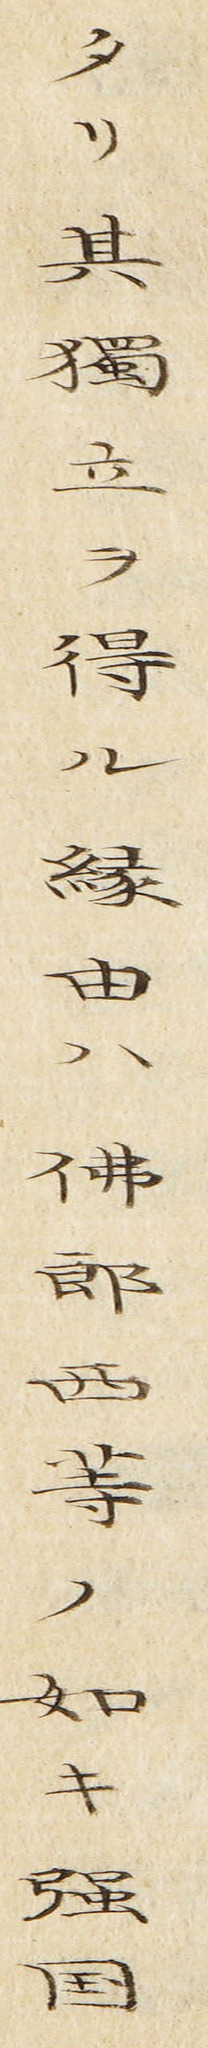タリ其獨立ヲ得ル縁由ハ佛郎西等ノ如キ強国
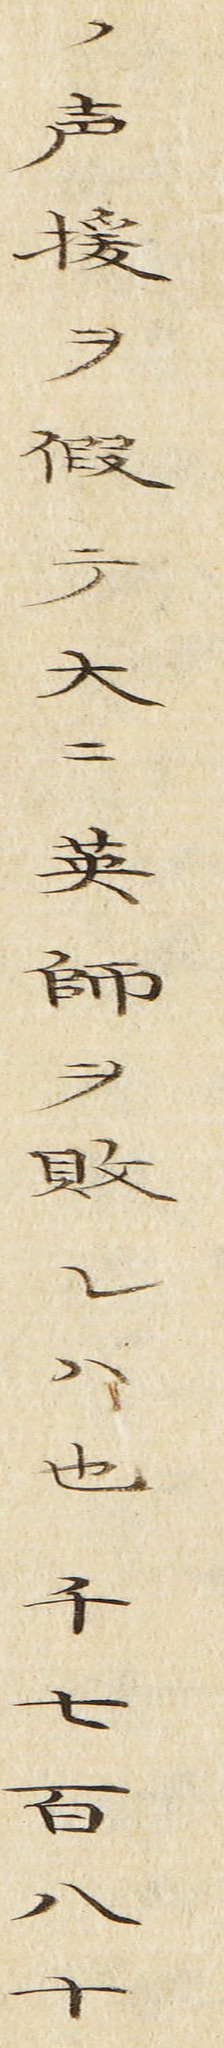ノ声援ヲ假大ニ英師ヲ敗レハ也千七百八十
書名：蕃談
